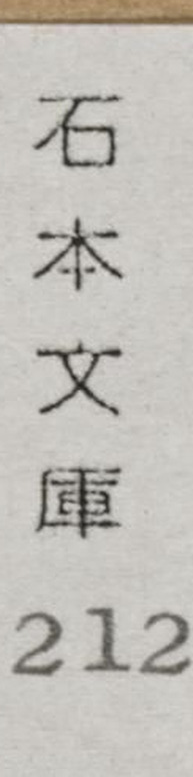石本文庫

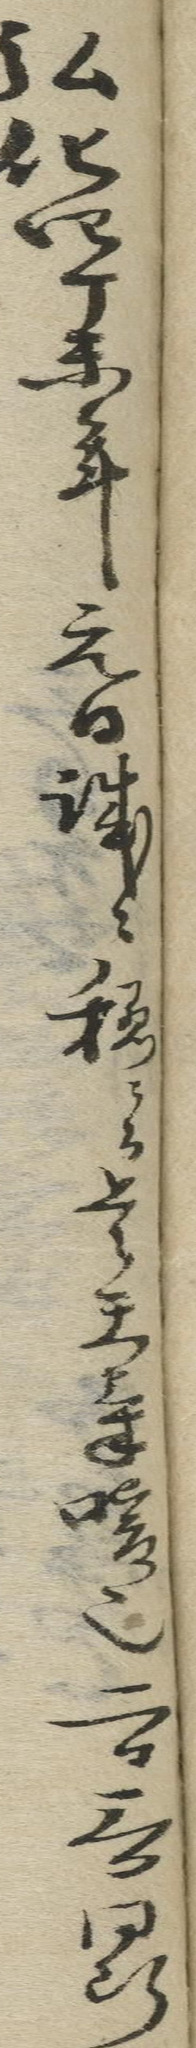弘化四丁未年元日誠ニ穏ニ而上々天気暖也二日三日同断
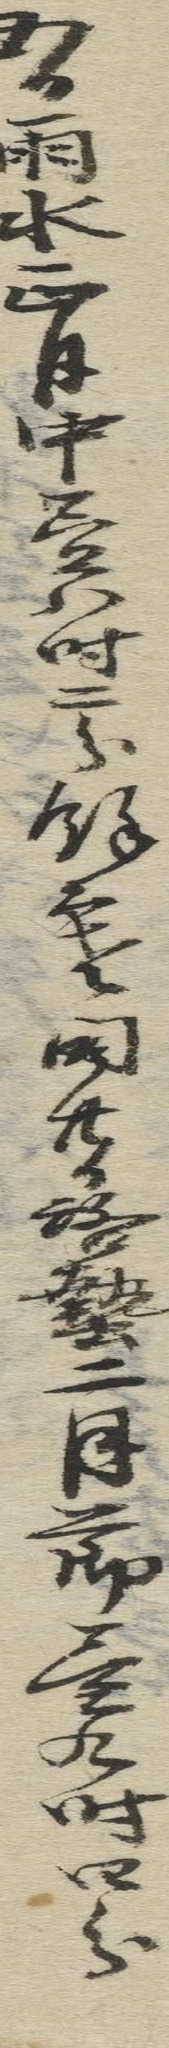五日雨水正月中昼八時二分餘寒同廿日啓蟄二月節昼九時四分
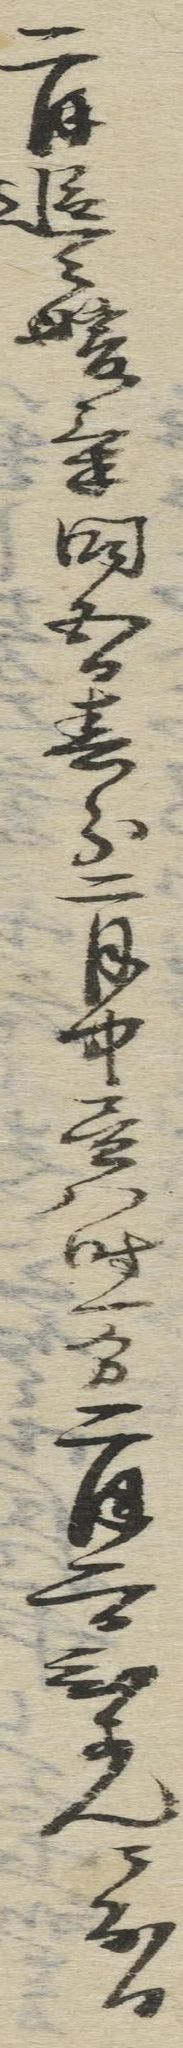二月追々暖気同五日春分二月中昼八時一分二月二日ひかん二なる
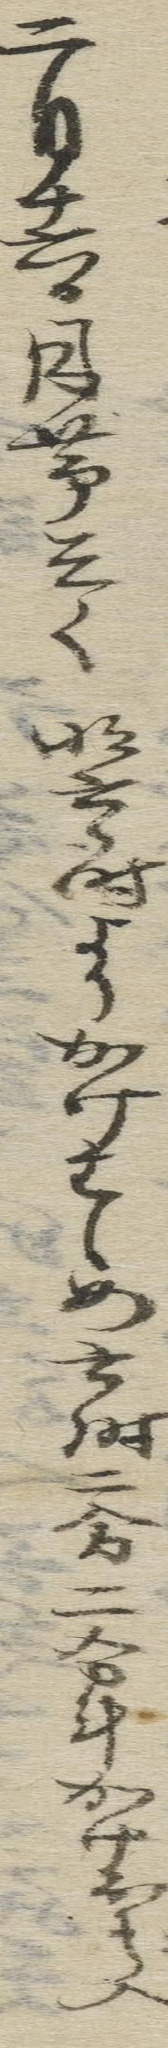二十六日月帯そく明六ッ時よりかけはしめ六時二分二分計かけなから入
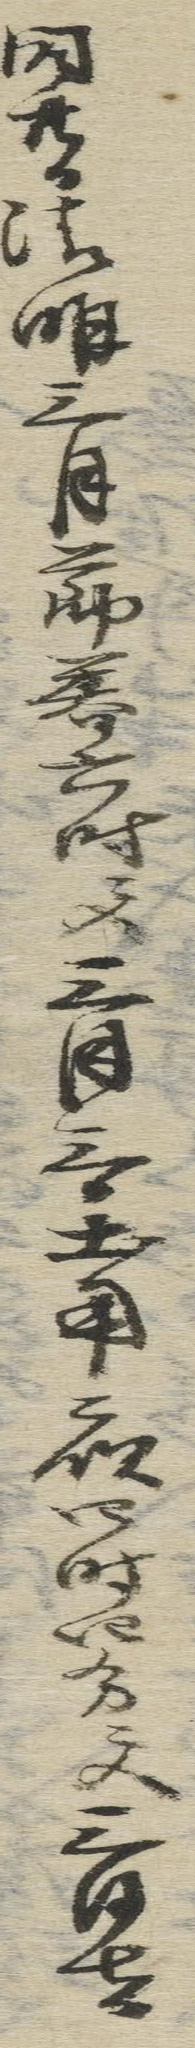同廿日清明三月節暮六時二入三月三日土用晩四時四分二入三月七日
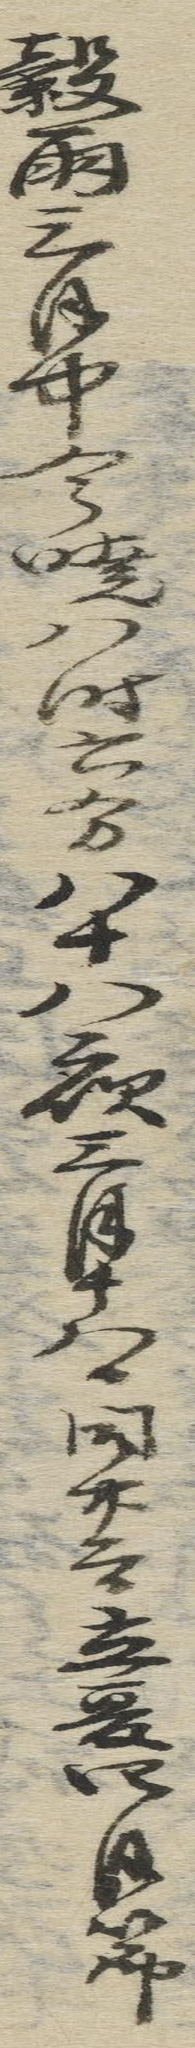穀雨三月中今暁八時六分八十八夜三月十八日同廿二日立夏四月節
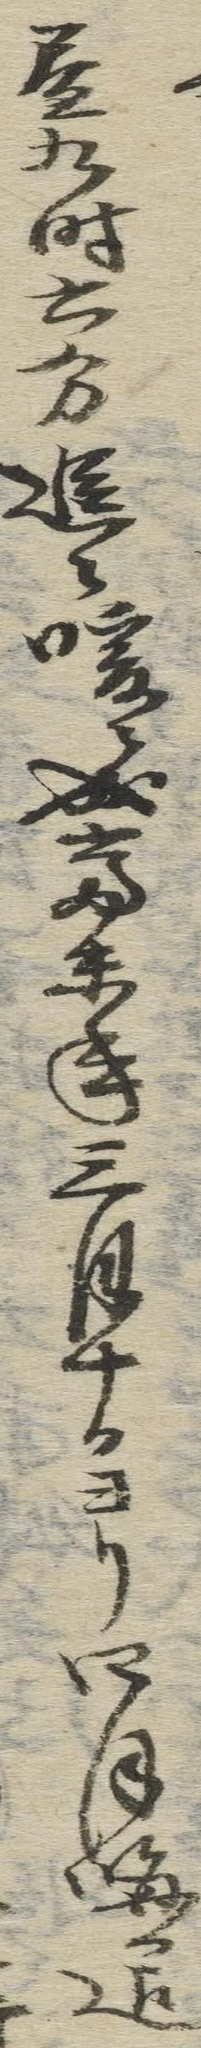昼九時六分追々暖二成当未年三月十日ヨリ四月晦日迄
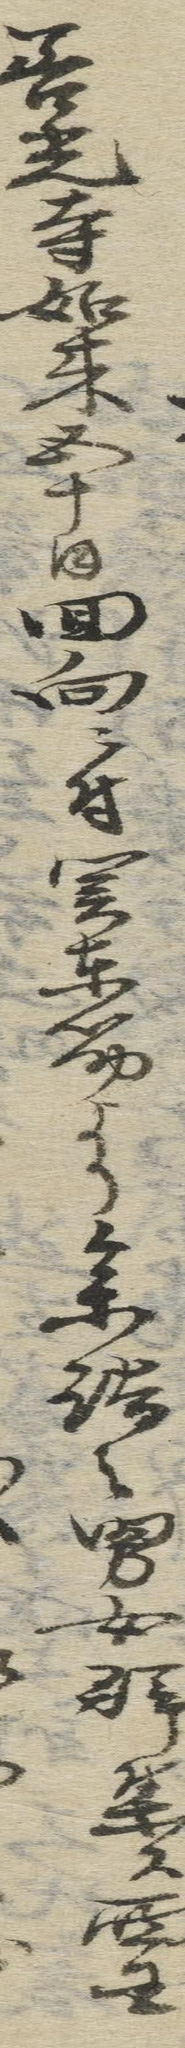善光寺如来五十日回向二付関東筋より参詣之男女群集ス西国
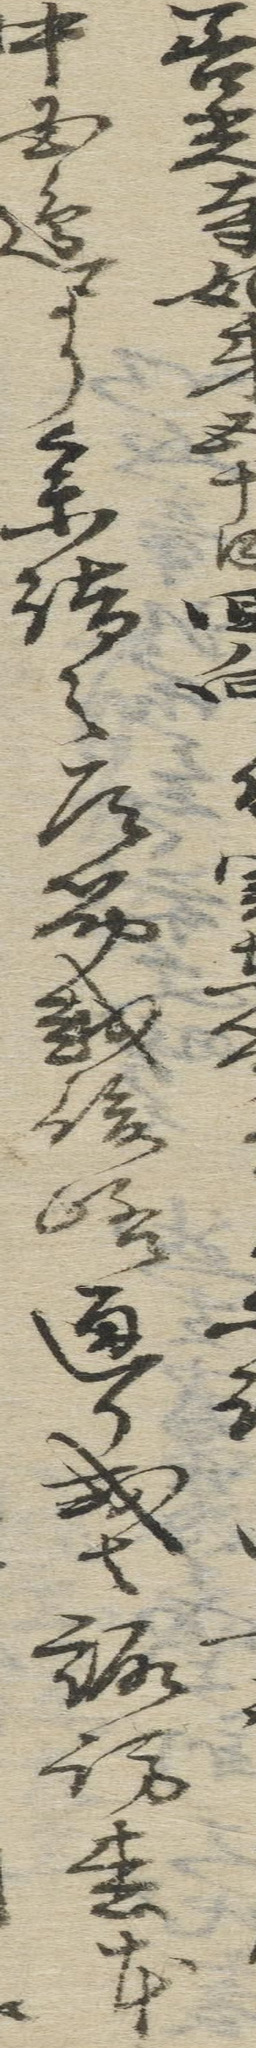中国辺より参詣之道筋越後路通り或者諏訪松本
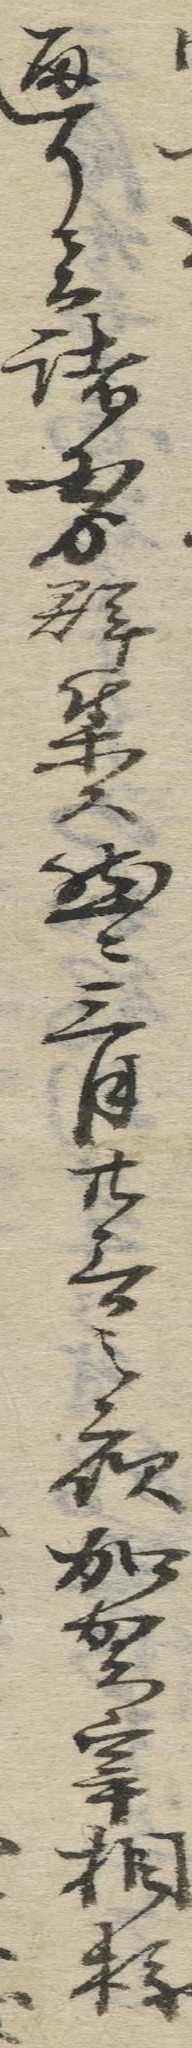通二而諸国ゟ群集ス然二三月廿三日之夜加賀宰相様
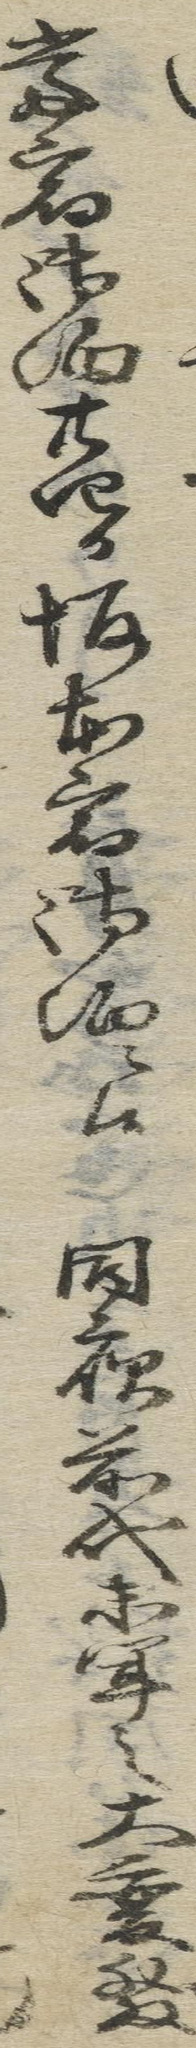当宿御泊廿四日坂本宿御泊二候同夜前代未聞之大変発
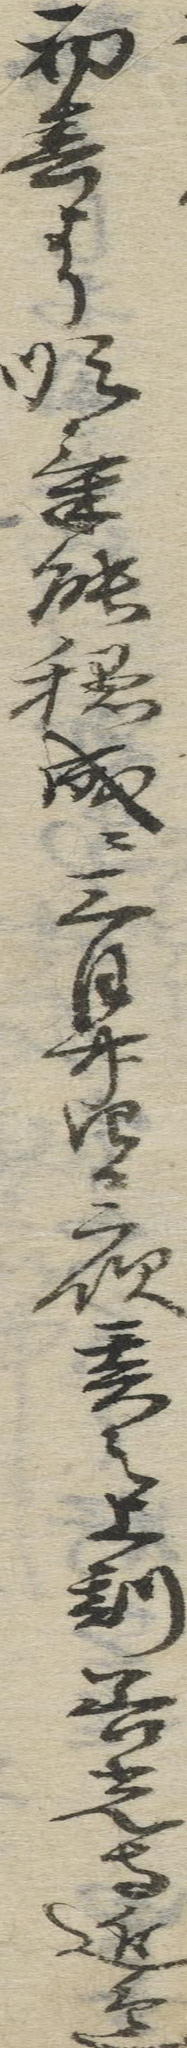初春より暖気能穏成三月廿四日夜亥之上刻善光寺近辺
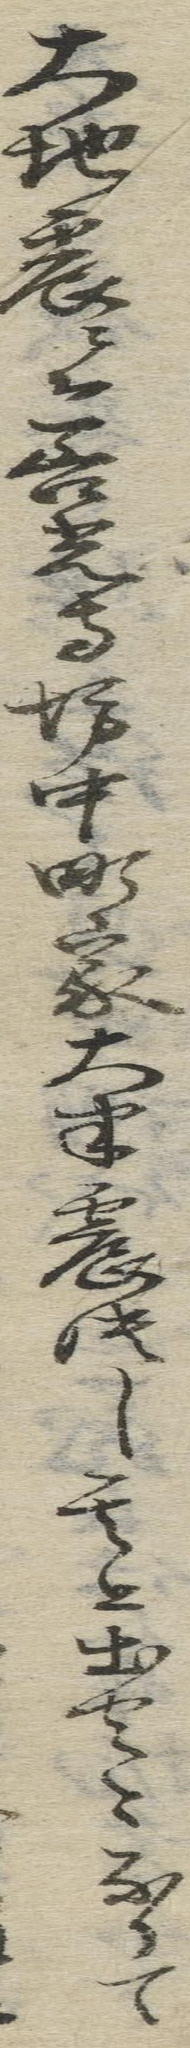大地震二而善光寺坊中町家大半震潰し其上出火二なりて
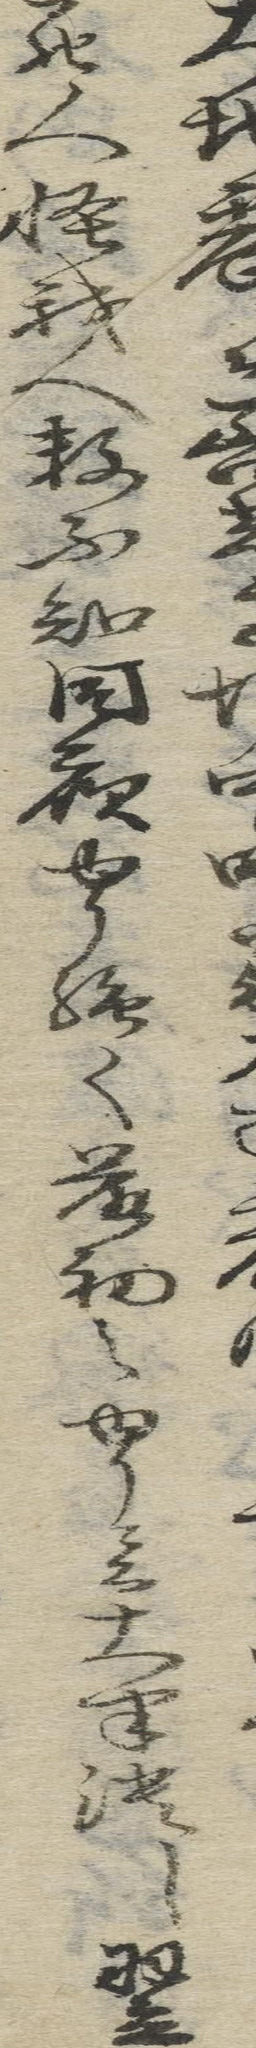死人怪我人数不知同夜ゆり強く最初之ゆり二而大半潰し翌
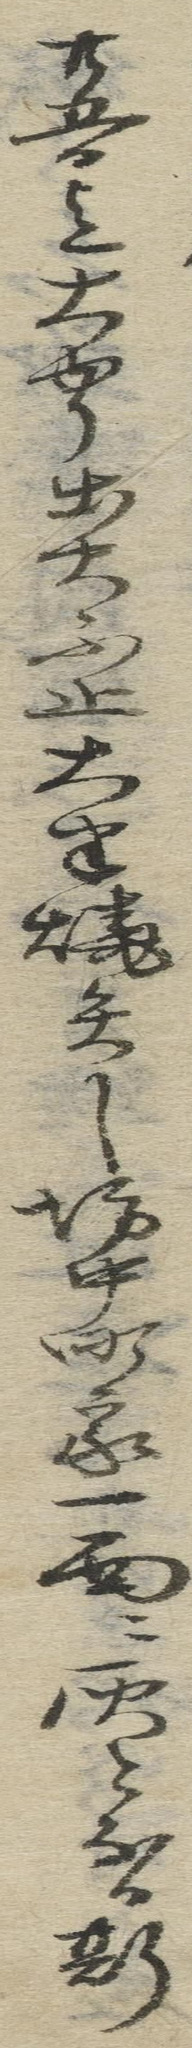廿五日迄大ゆり出火不止大半焼失し坊中町家一面二灰となる斯
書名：信濃越後　地震書留
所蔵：東京大学地震研究所図書室 Earthquake Research Institute Library, The University of Tokyo, JAPAN
